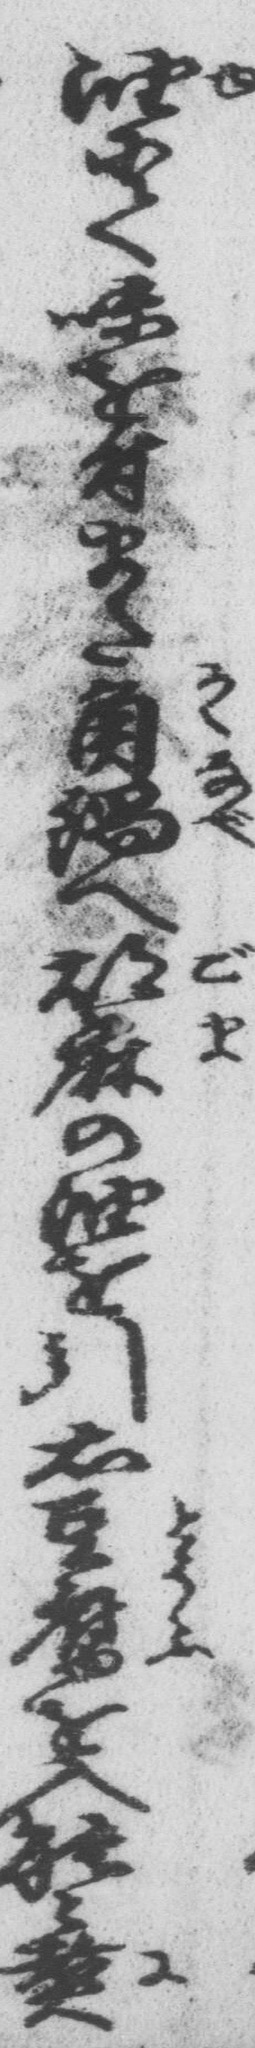油にて味を付また角鍋へ胡麻の油を引右豆腐を入能々煮
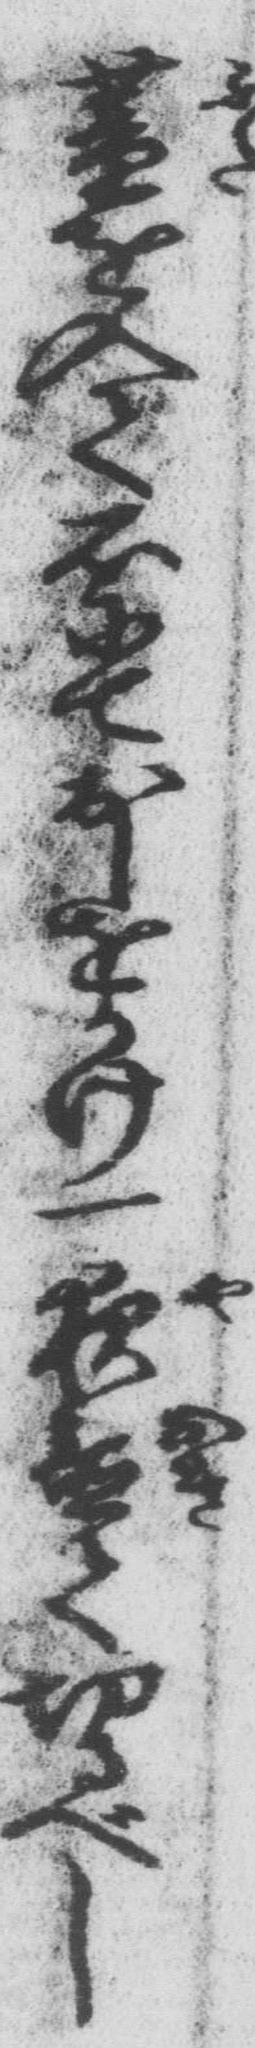蓋を〆ておしをかけ一夜置きて切るべし
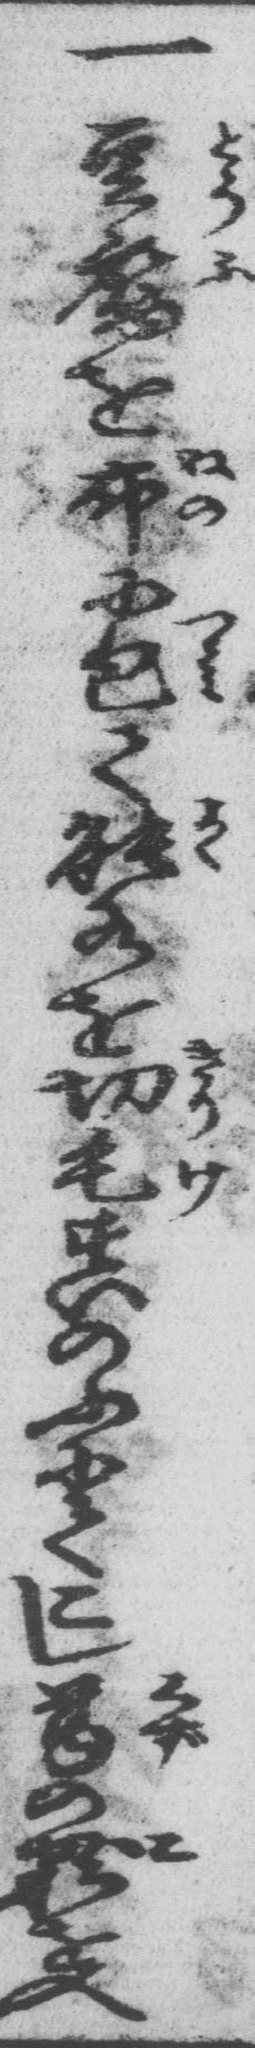一豆腐を布に包て能水を切毛すいのうにてこし葛の粉を入

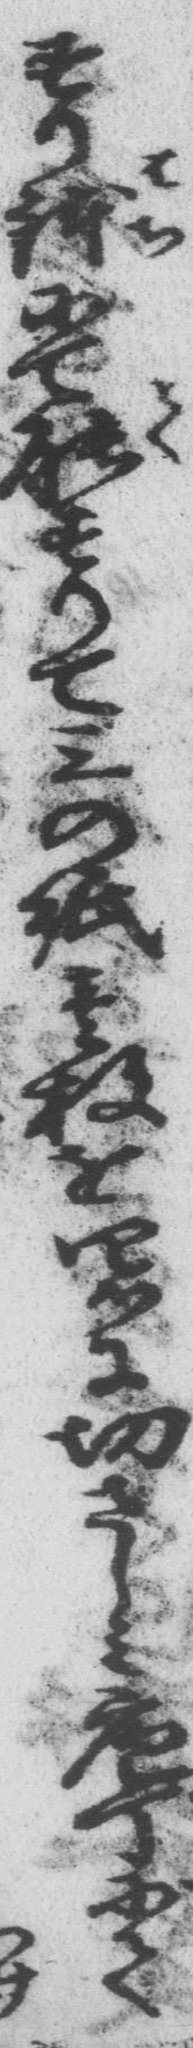すり鉢にて能すりてミの紙をに切さして庖丁にて
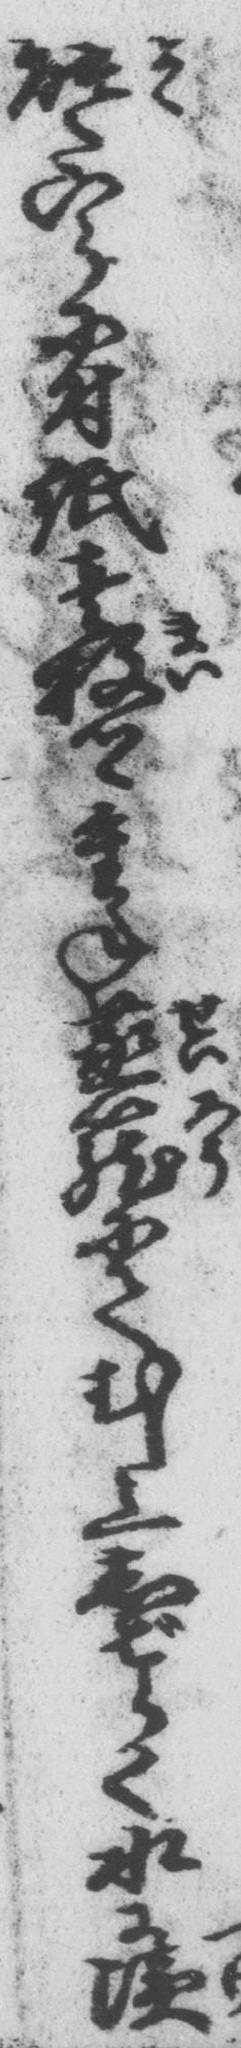能々たいらに付紙壱枚ツヽ重ね蒸籠にてむし上しばらく水に漬
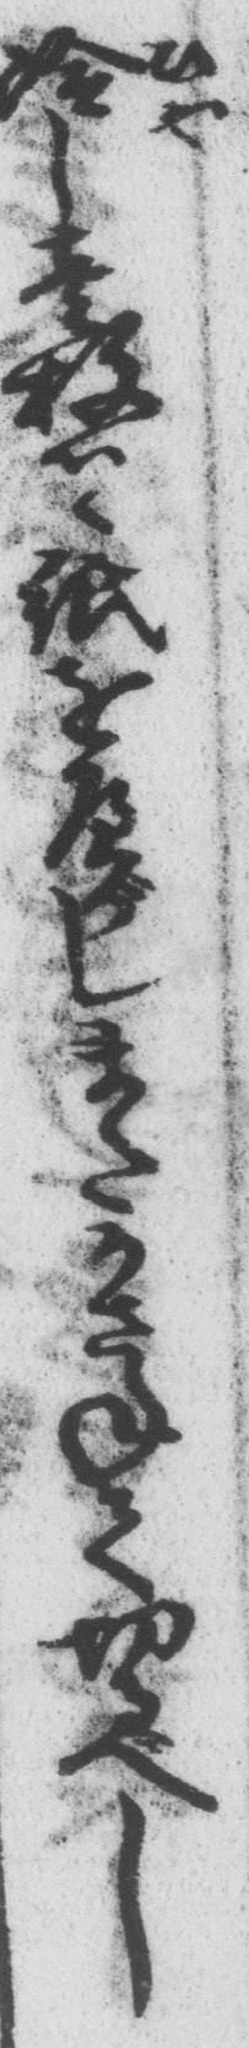冷し壱枚ツヽ紙をへがしまたかさねて切るべし
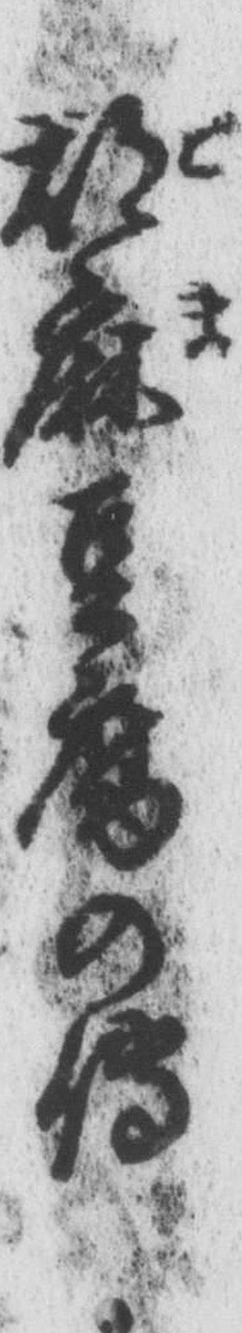胡麻豆腐の傳
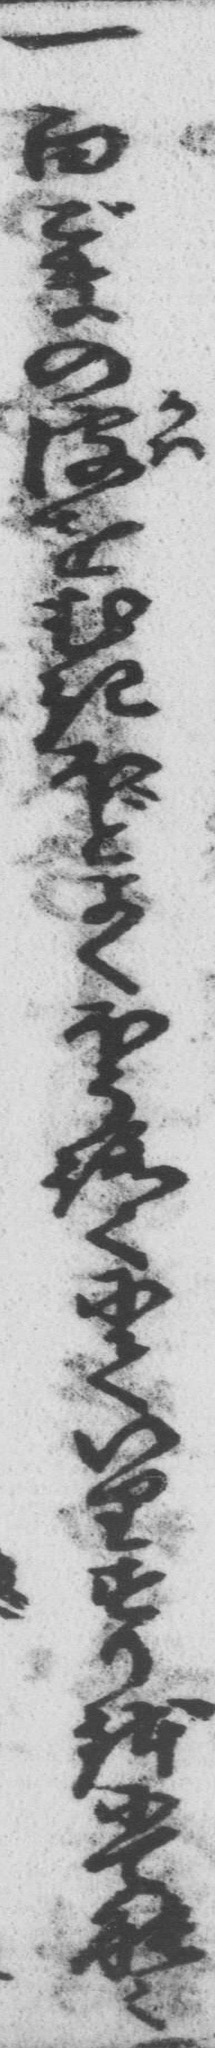一白ごまの皮をむきほとよくほうてにていりすり鉢にて能々
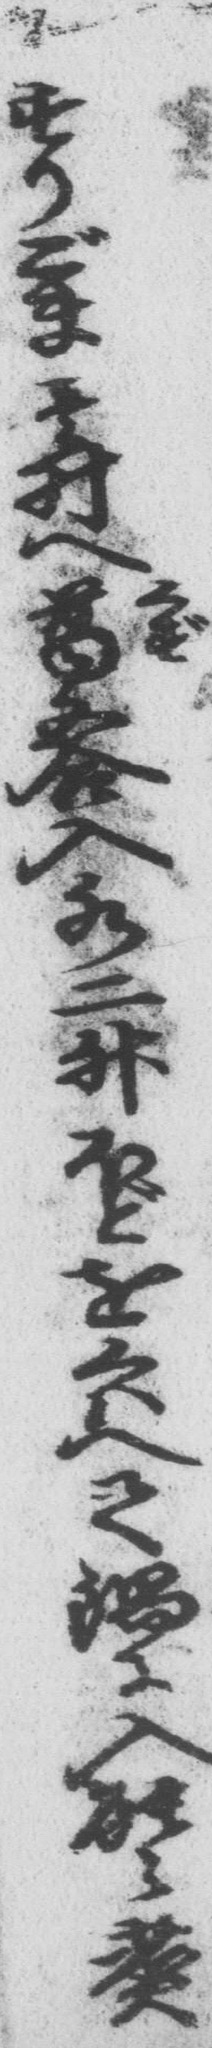すりごま升へ葛五合入水二升ほどをくハへて鍋に入能々煮
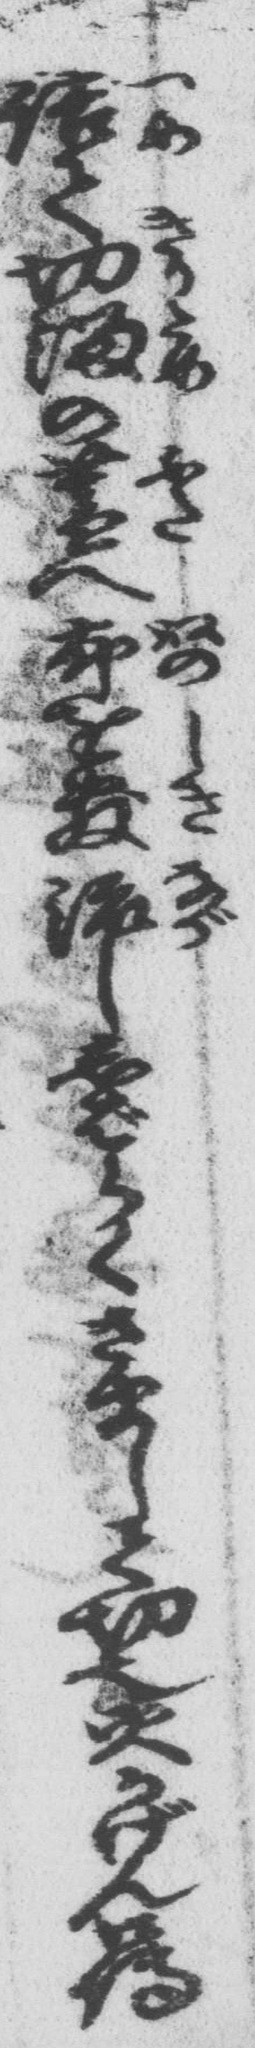詰て切の蓋へ布を敷流ししばらくさまして切火かげん口傳
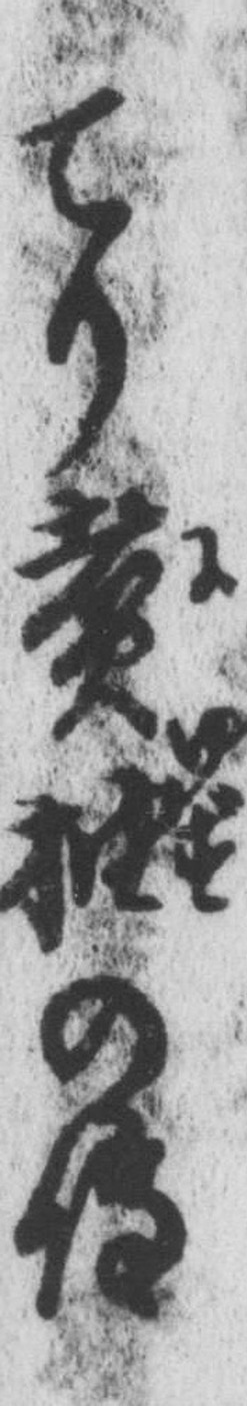てり煮柚の傳
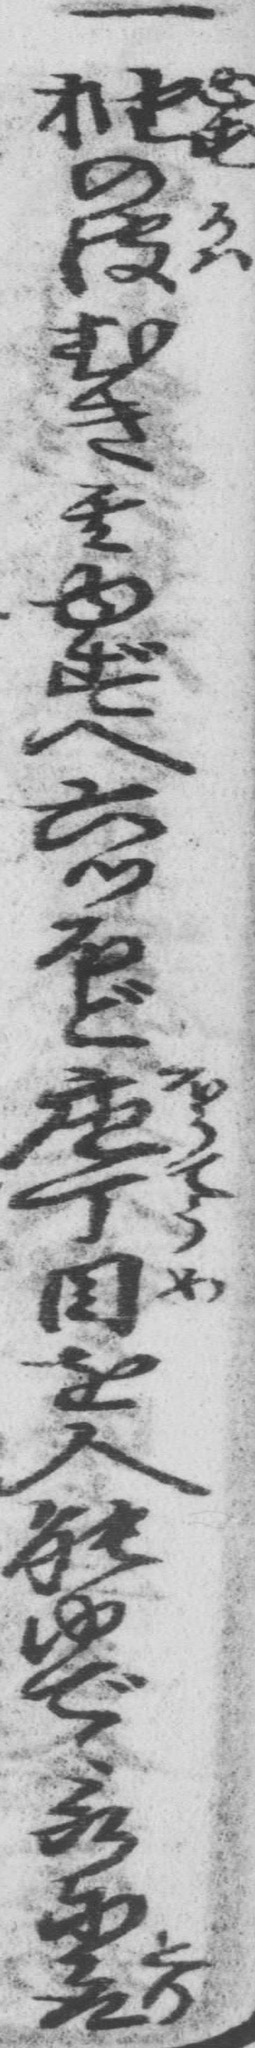一柚の皮むき其ゆずへ六ツほど庖丁目を入能ゆでゝ水に取
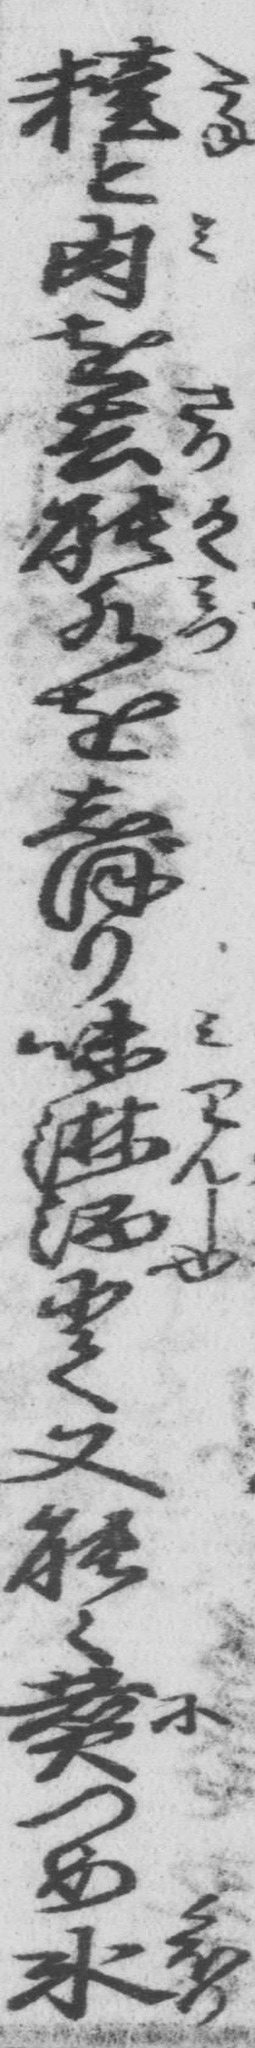種と肉を去り酢水をしぼり酒にて又能々煮つめ
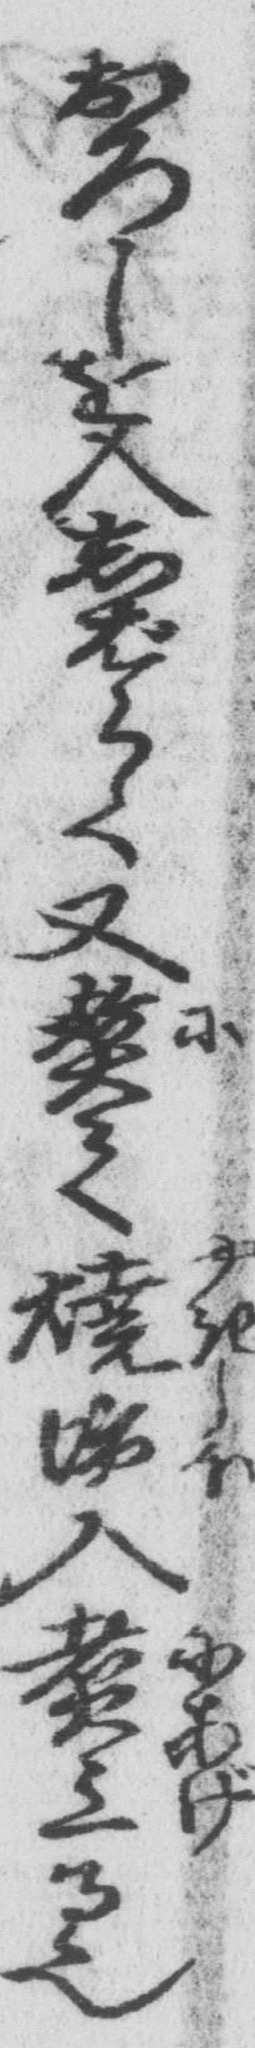おろしを入しばらく煮て焼塩入煮上る也
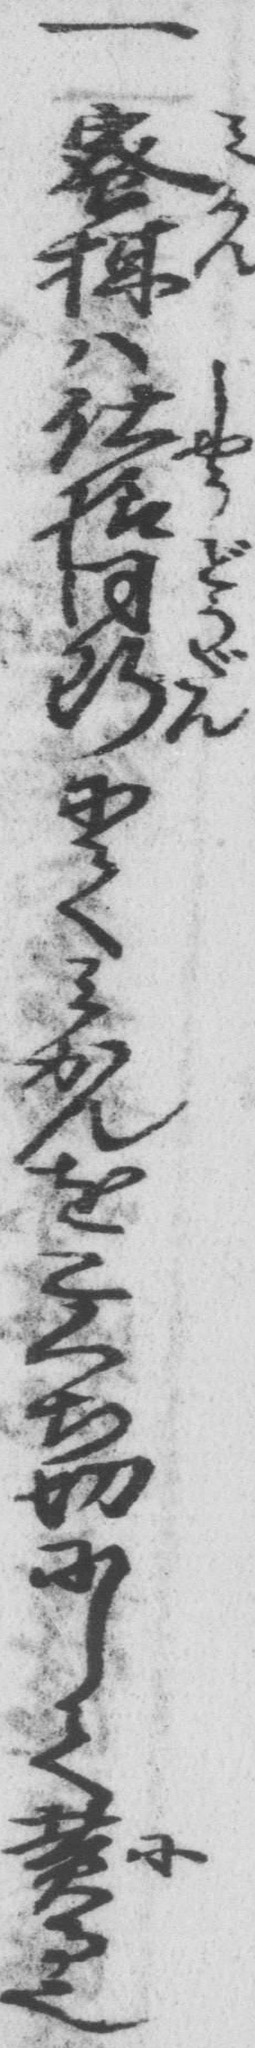一蜜柑ハ仕様同段にてミかんをこくちしして煮る也
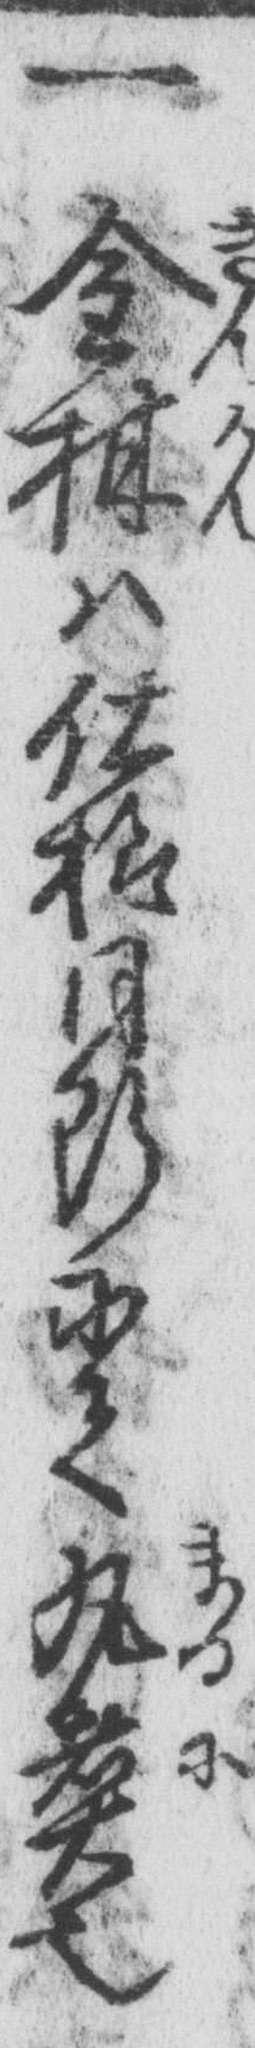一金柑ハ仕様同段にて丸煮なり
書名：当世料理献立
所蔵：大阪府立大学学術情報センター 国文学研究資料館
